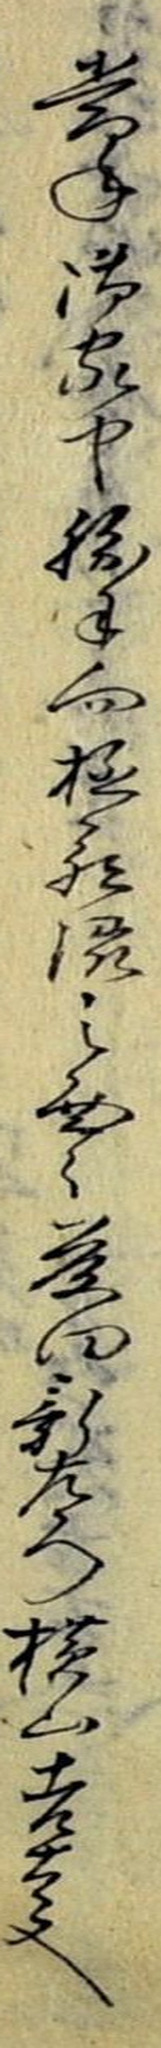当年御家中勝手向極難渋之面々藤田新左衛門横山吉太夫
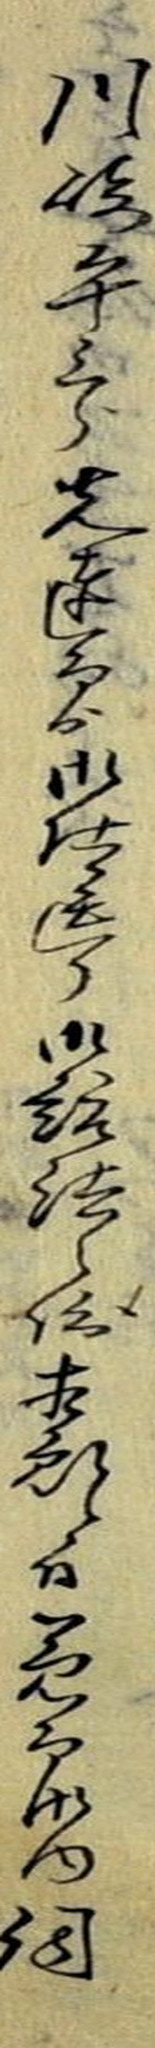川崎平三郎先達而ゟ御仕送り御趣法之儀相願候に付兼而御内調
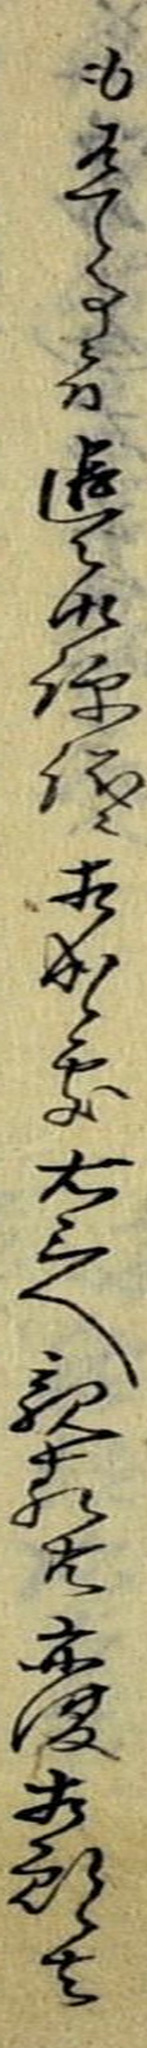も有之事に付追々御評議に相成候処右三人親類共亦復相願候は
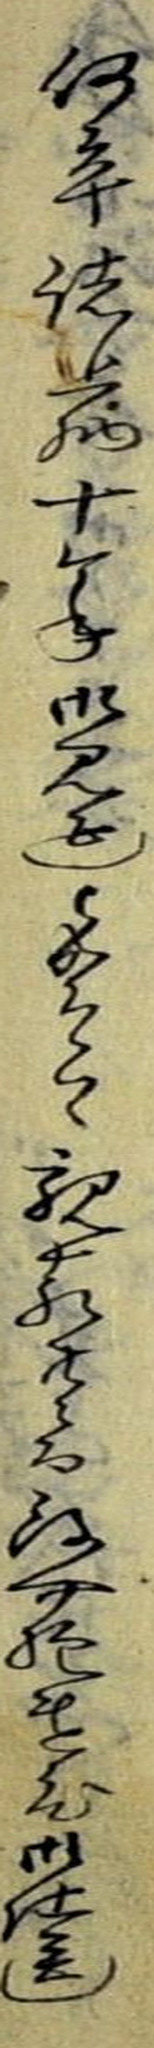何卒諸上納十ヶ年御見延被成下候はヽ親類共に而致介抱遣度御仕送
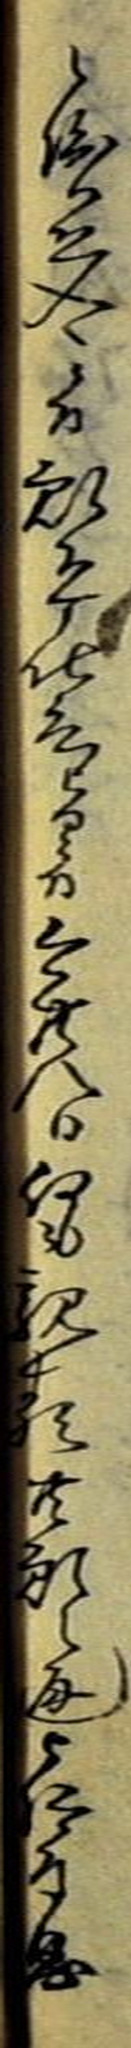之儀は恐入候に付願下ヶ仕度旨に付今廿八日何も親類共願之通被仰付儀
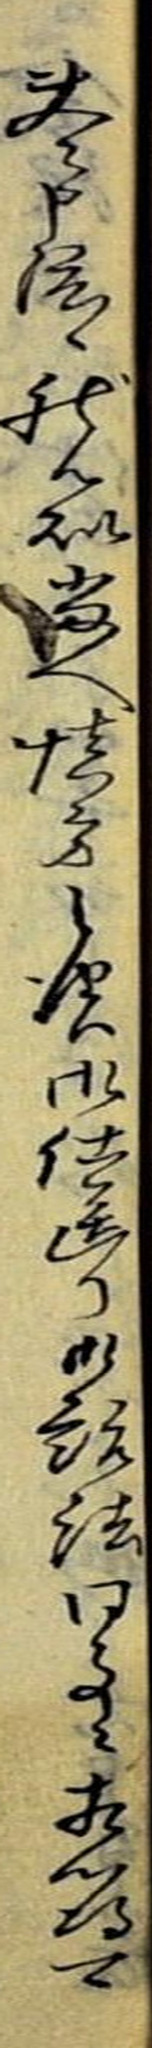夫々申渡候然ル処当人慎方之儀は御仕送り御趣法同事に相心得可
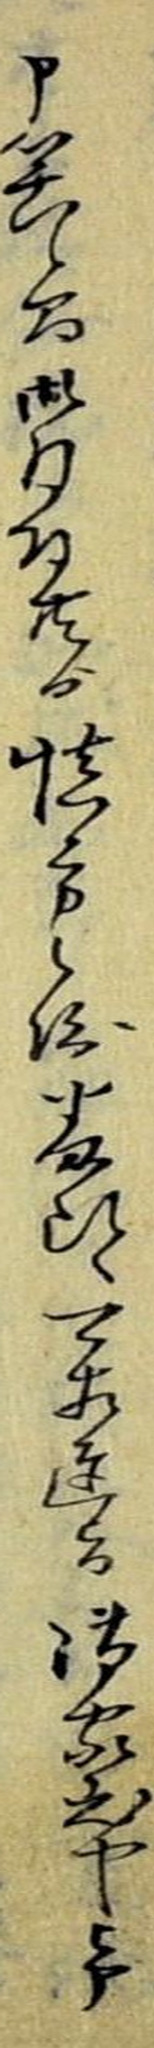申筈候間御目付共ゟ慎方之儀番頭へ可相達旨御家老中被申
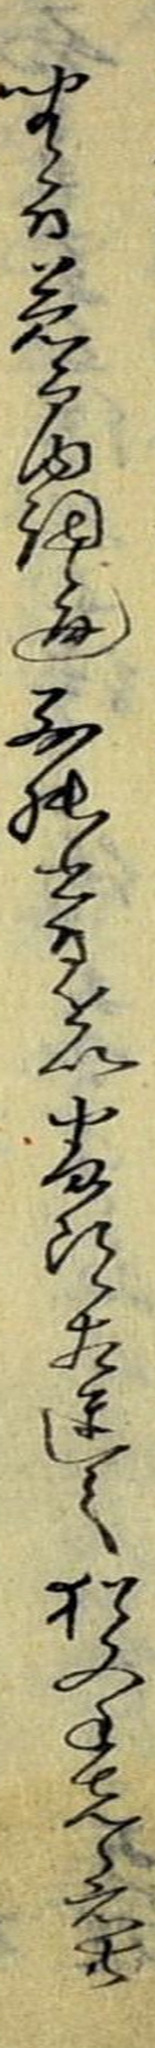聞候に付兼而内調之通別紙書付を以番頭へ相達之猶又手先之者共
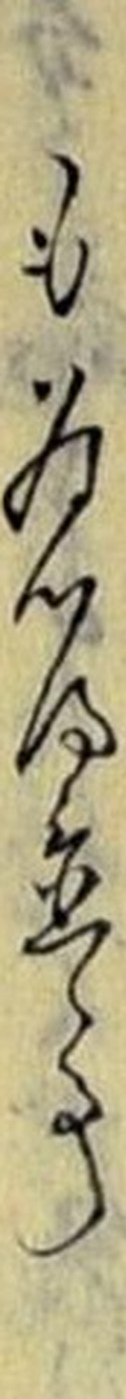へも為心得置候事
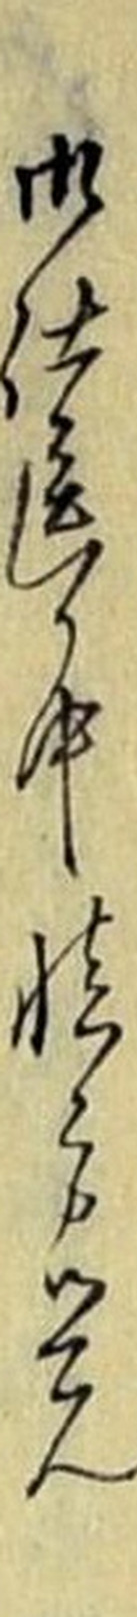御仕送り中慎方覚
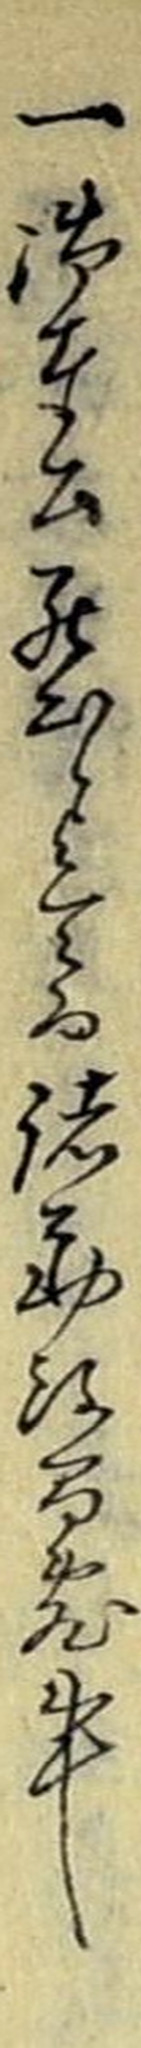一御奉公罷出候迄に而諸勤致間敷事
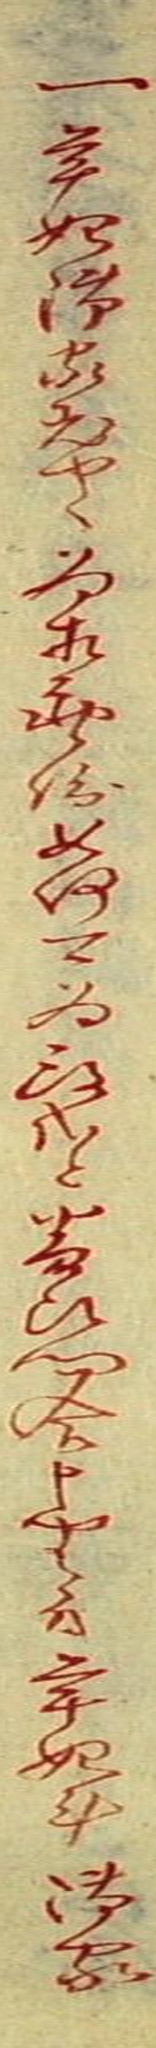一年始御家老中へ為相勤候儀如何可為致哉と番頭問合申聞候に付年始斗御家
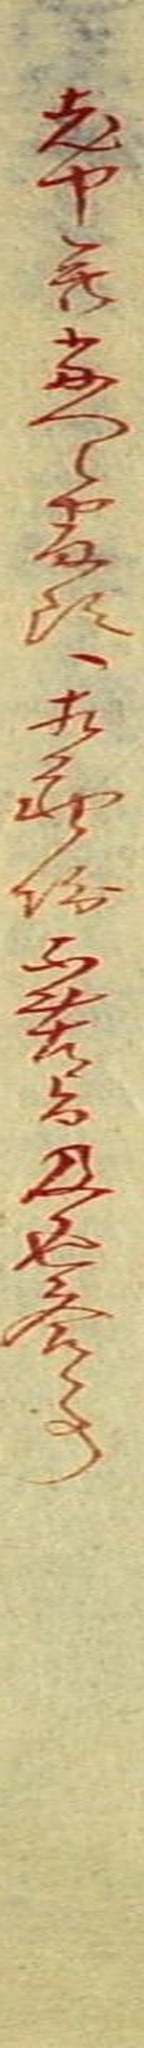老中井当人之番頭へ相勤候儀不苦旨及返答候事
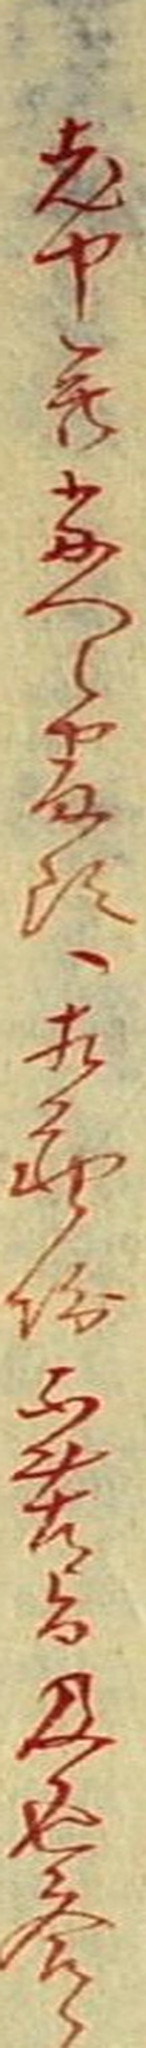老中井当人之番頭へ相勤候儀不苦旨及返答候事
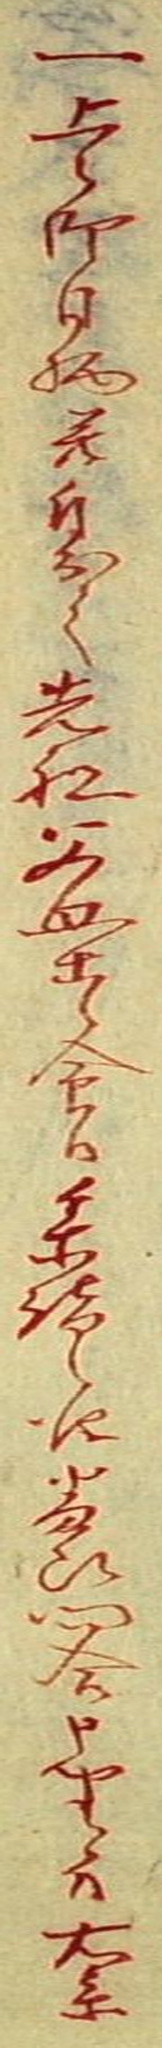一上之御日柄井自分之先祖父母之命日参詣之儀番頭問合申聞候に付右参
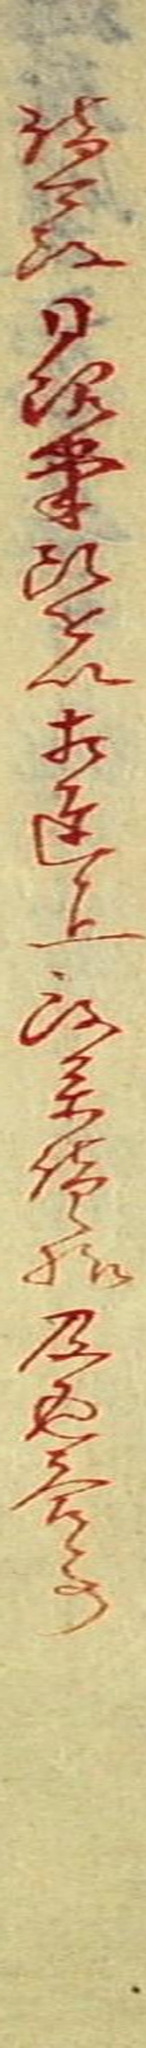詣可致日限筆頭を以相達候上致参詣候様及返答候事
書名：命令之部 六
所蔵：福井県文書館 Fukui Prefectural Archives
